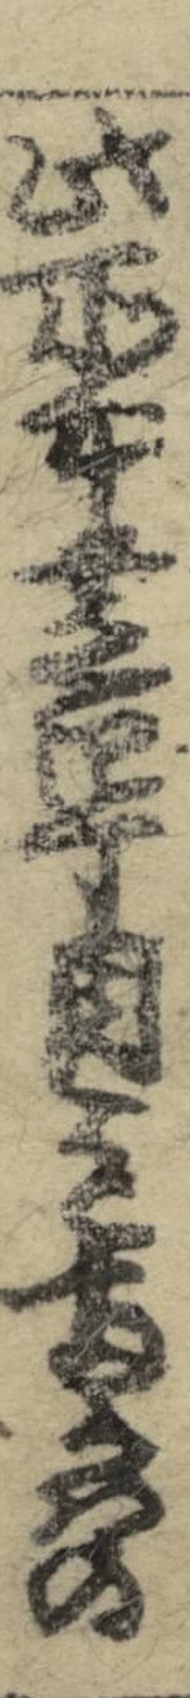此所中芝四丁目迄両がはの
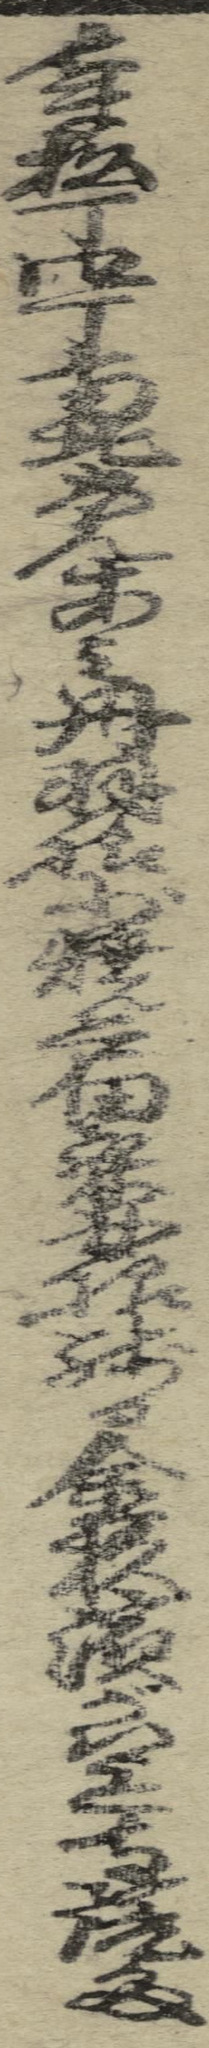はま松丁四丁南北めんあミ丹羽様少焼戸田采女様残る金杉浜がは迄寺院多
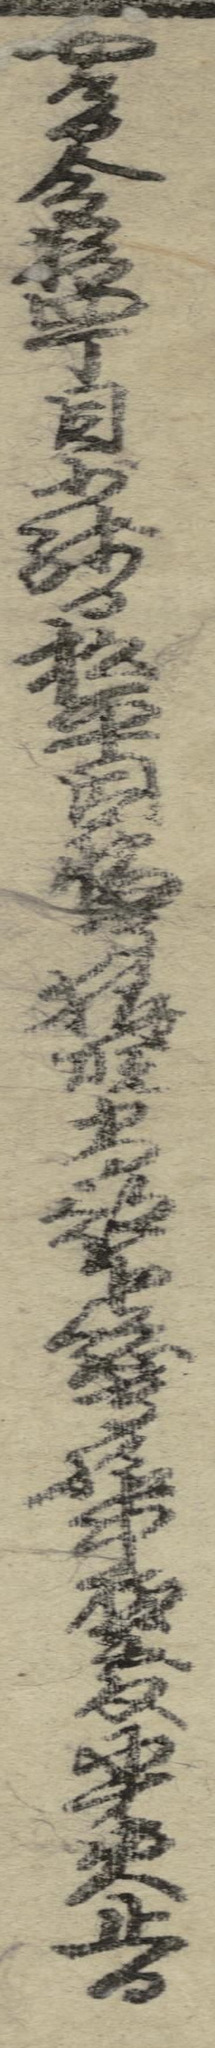やける金杉四丁目少残る松平因幡守様？尚部下総守様中屋敷にて火止る
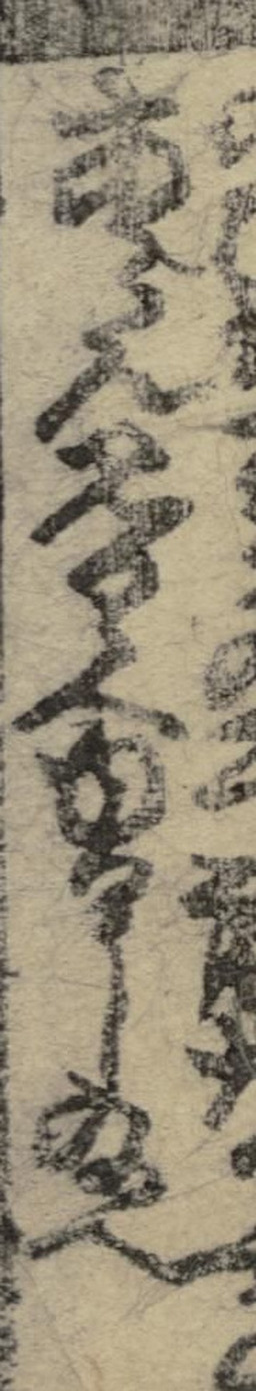あらん見る人ゆるし給へ
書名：[嘉永三年二月の江戸大火に関する瓦版]
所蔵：東京大学地震研究所図書室 Earthquake Research Institute Library, The University of Tokyo, JAPAN
